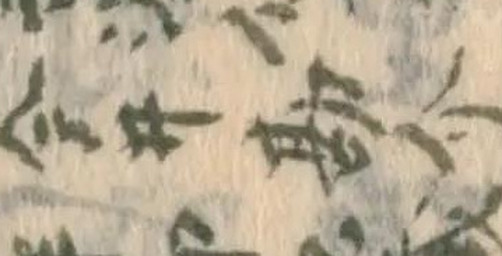今井勘介
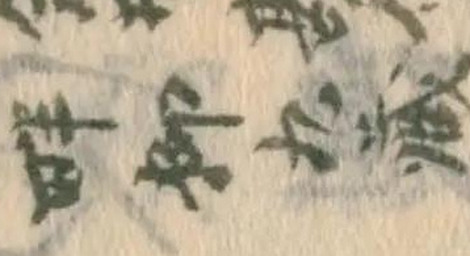畔柳久蔵
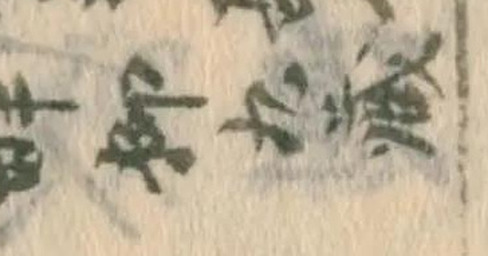畔柳久蔵
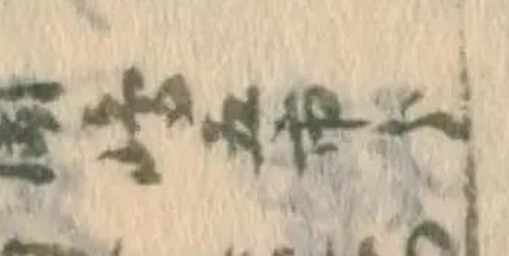岡崎五市郎
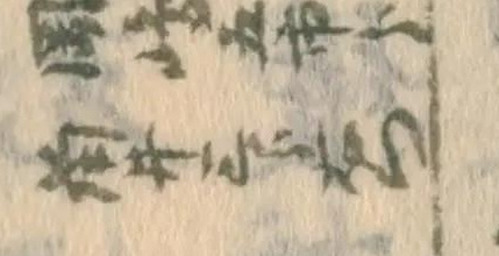角井三郎右衛門
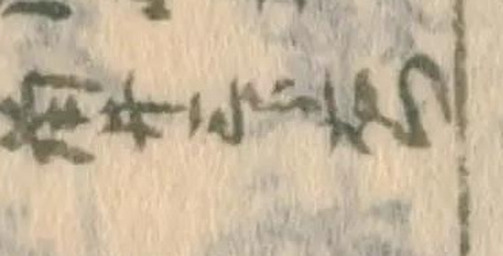角井三郎右衛門
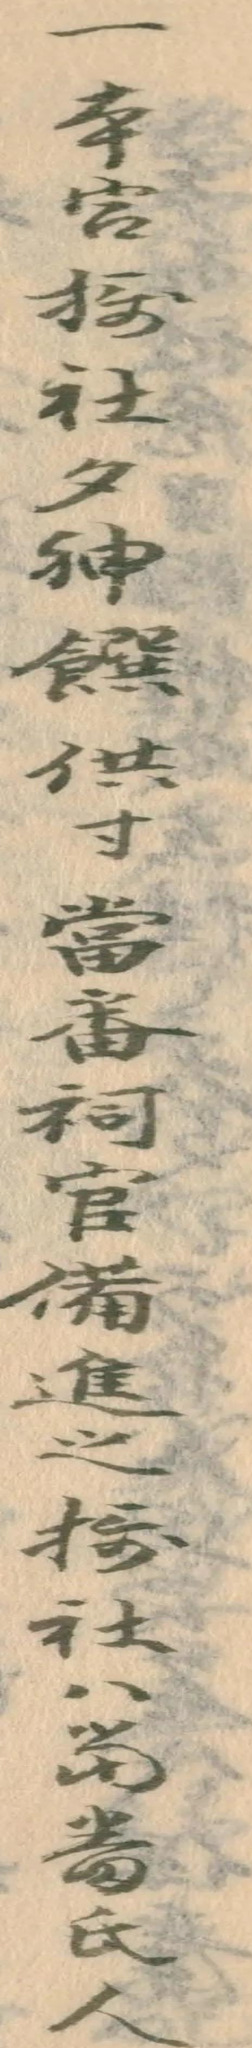一本宮摂社夕神饌供す当番祠官備進之摂社ハ当番氏人
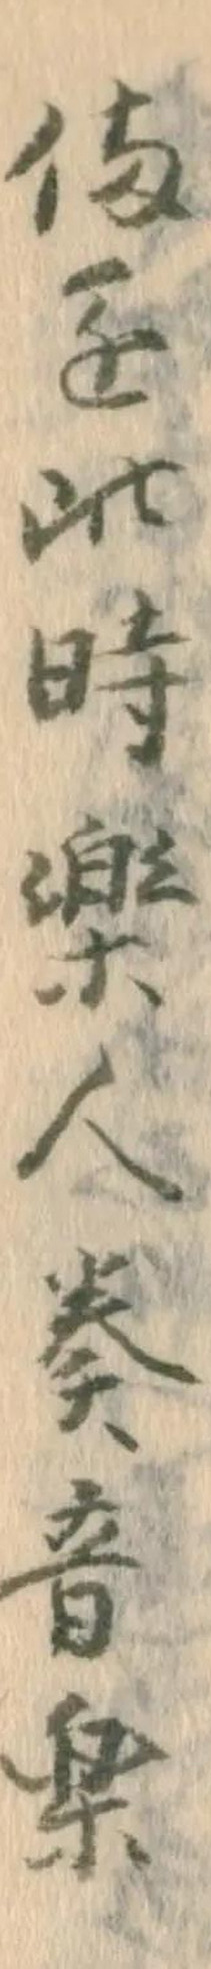備進此時楽人奏音楽
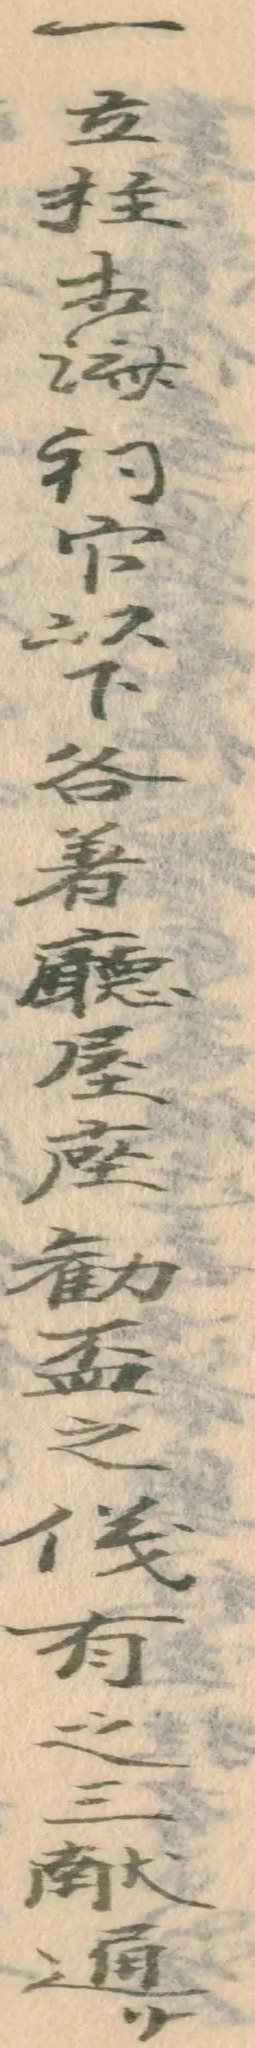一立柱相済祠官以下各着庁屋座勧盃之儀有之三献通リ
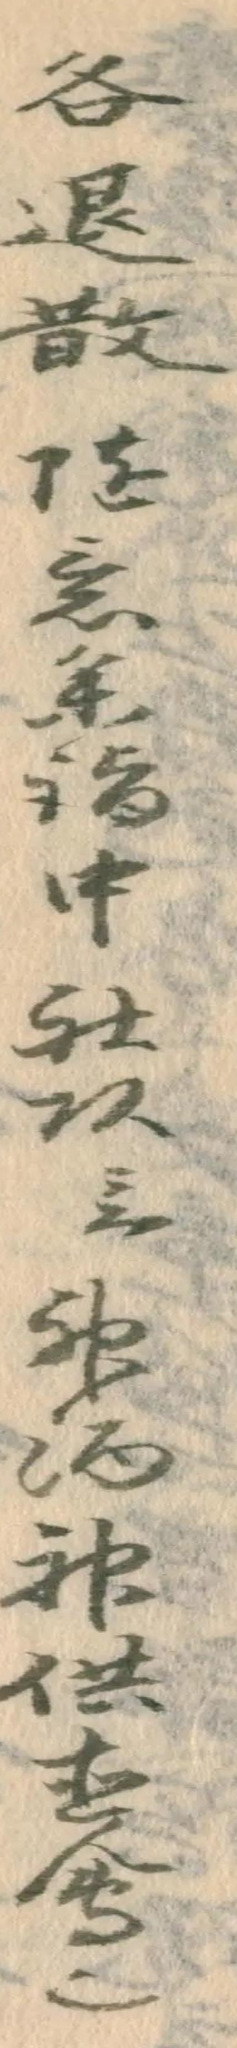各退散随意参詣中社頭ニ而神酒神供直会也
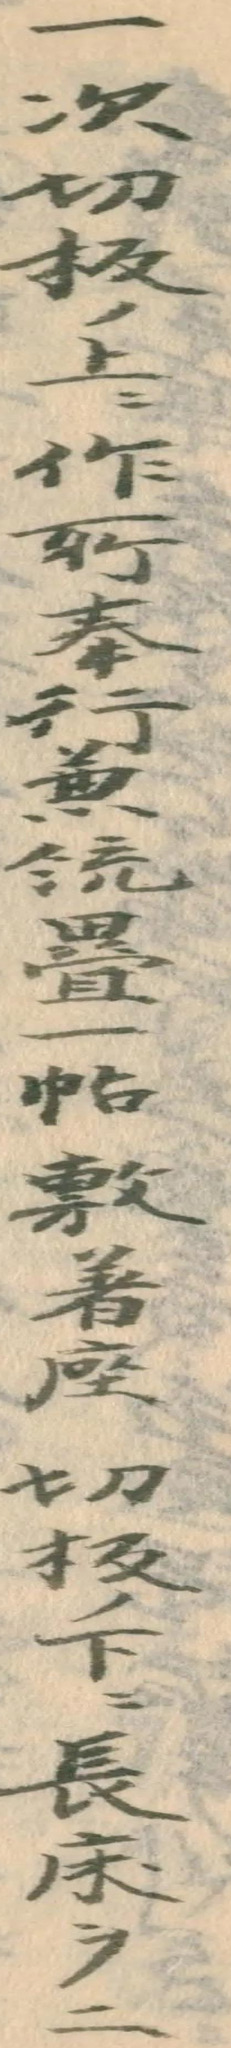一次切板ノ上ニ作所奉行兼統畳一帖敷着座切板ノ下ニ長床ヲ二
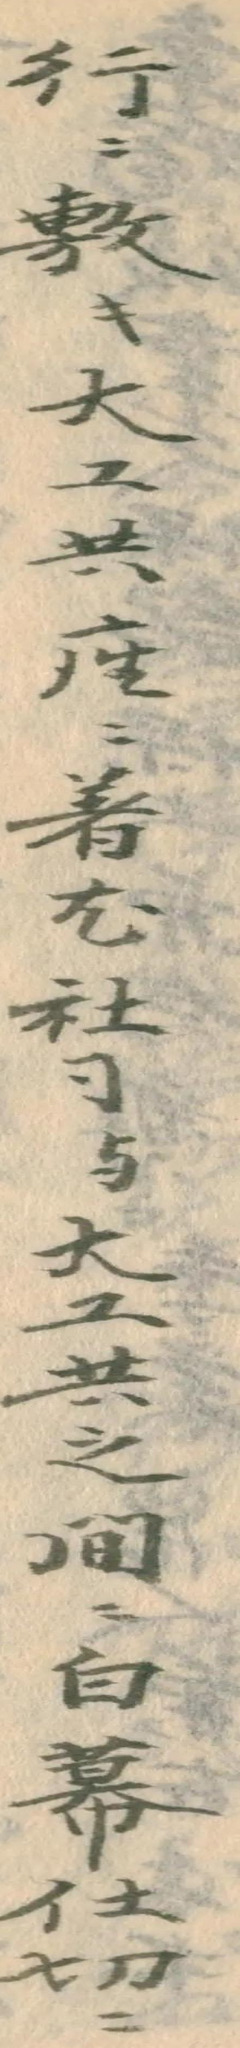行ニ敷キ大工共座ニ着尤社司与大工共之間ニ白幕仕切ニ
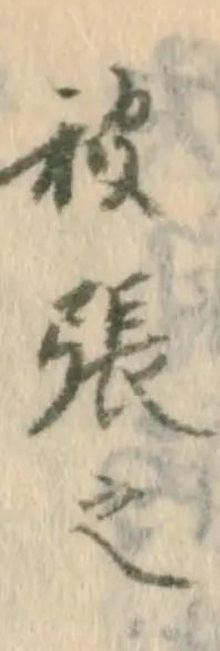被張也
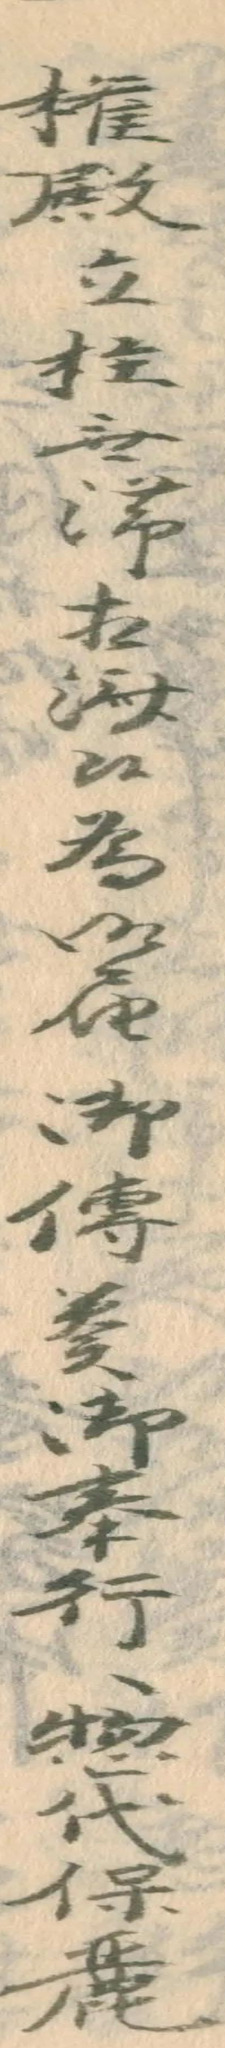一権殿立柱無滞相済候為御届御伝奏御奉行へ惣代保麗
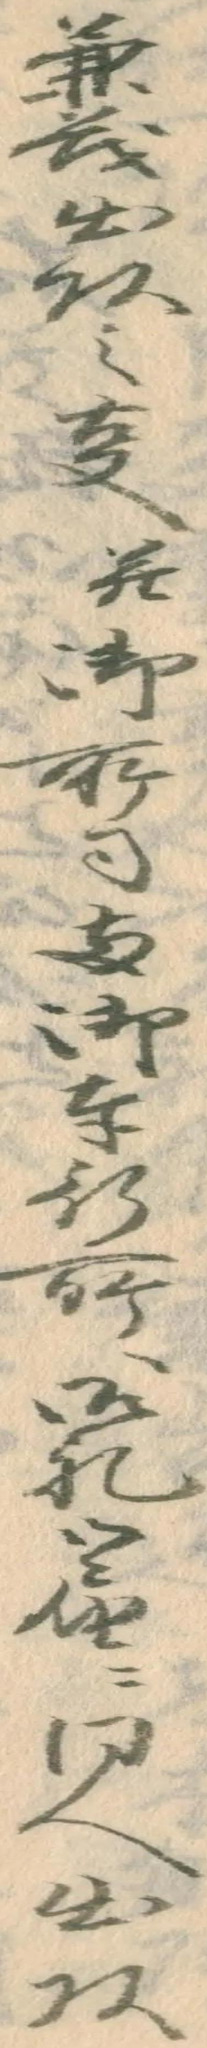兼茂出頭之事并御所司両御奉行所へ御礼御届ニ同人出頭
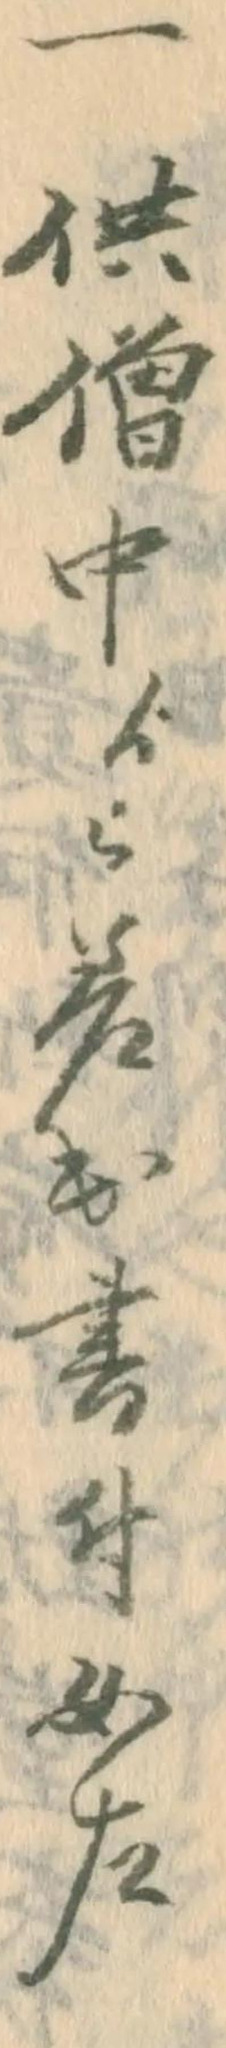一供僧中ゟ被差出書付如左
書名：賀茂社記録. 第17冊
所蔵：国立国会図書館 National Diet Library, JAPAN
